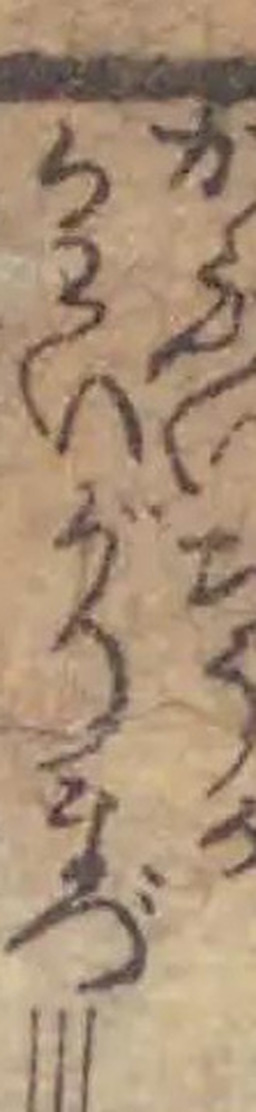かわいがりまづ
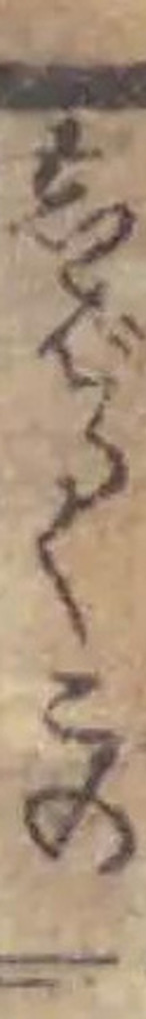しばらくこの
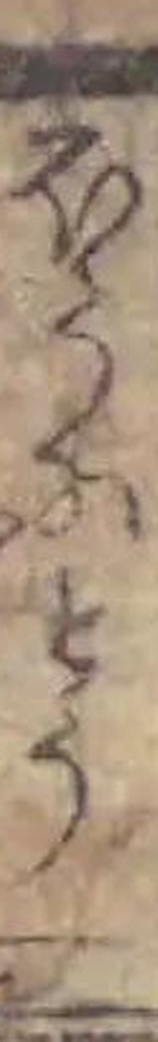ほうにとう
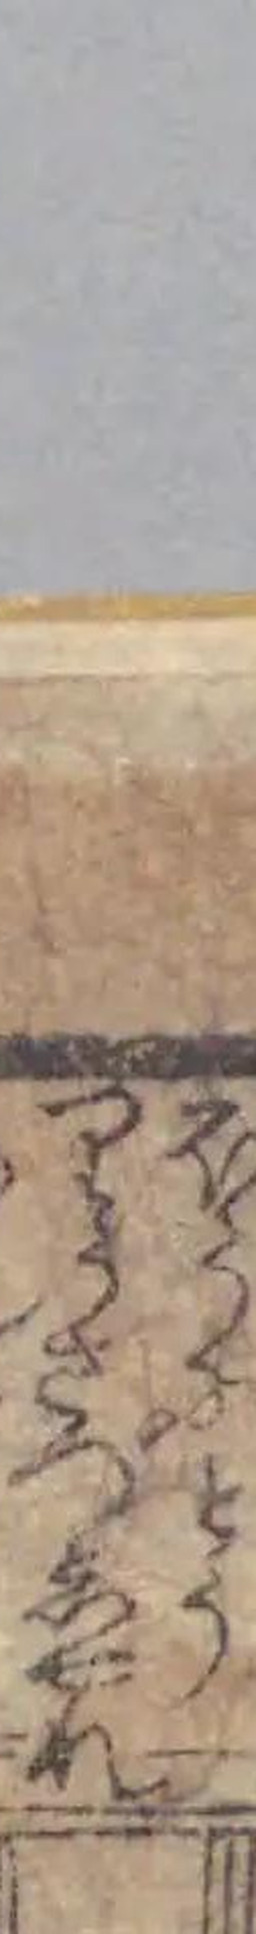りうさつしやれ
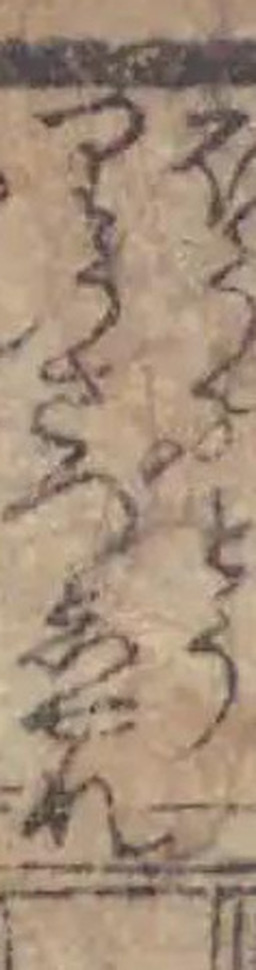りうさつしやれ
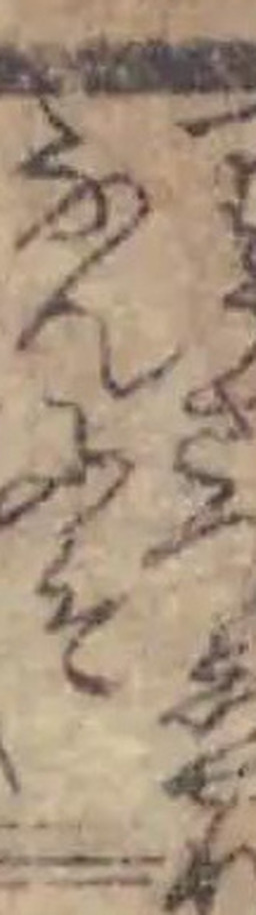なんにも
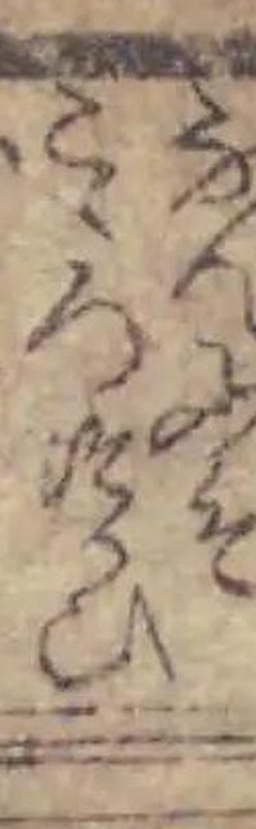こゝろつかひ
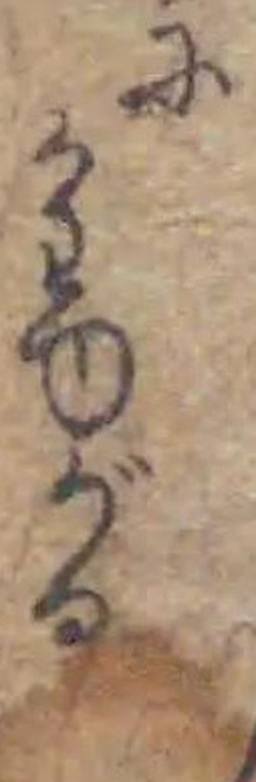かわゆがる

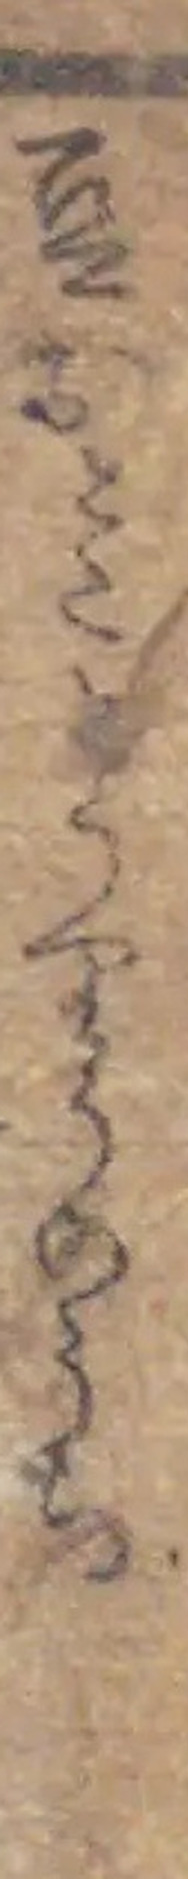豆おとことうりうのうち
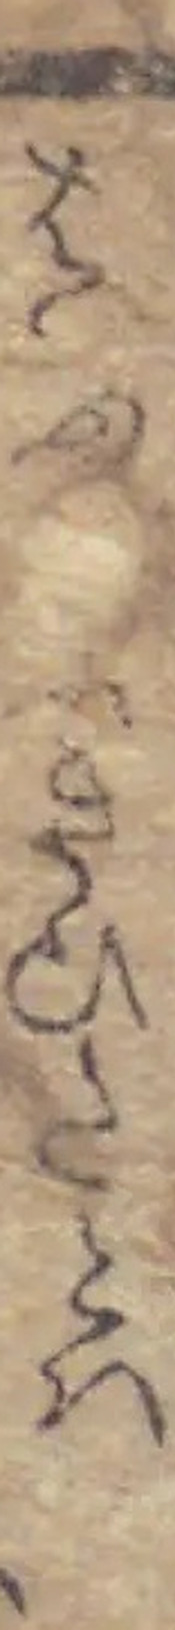はなにきひたとハ
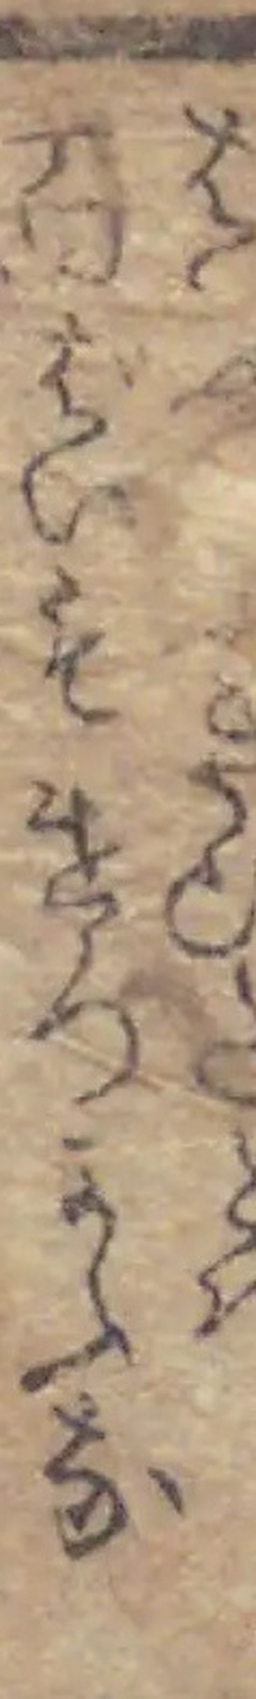百ばいもけつかふな
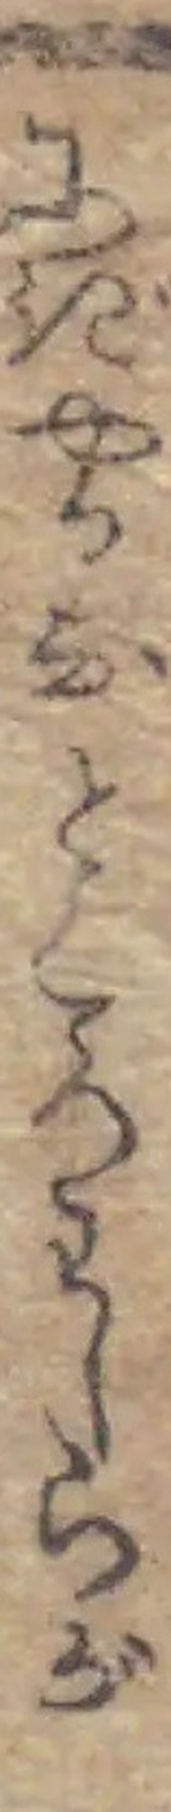にぎやかなところわしらが
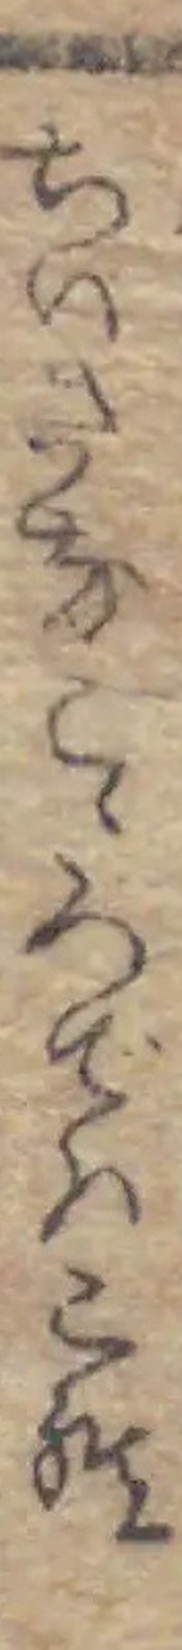ちいさなこゝろでハこの
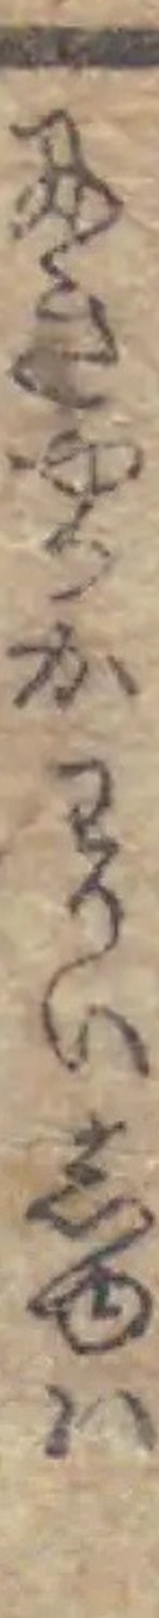にきやかかわかいしゆハ
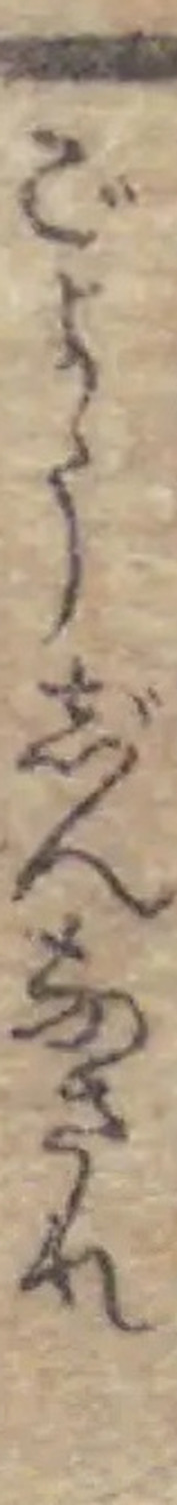ごようじんなされ
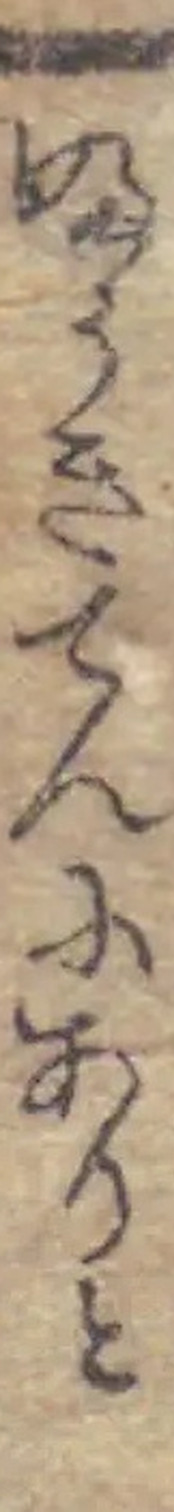ふうきてんにありと
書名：豆男江戸見物 2巻
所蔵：国立国会図書館 National Diet Library, JAPAN
